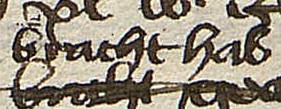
bracht hab
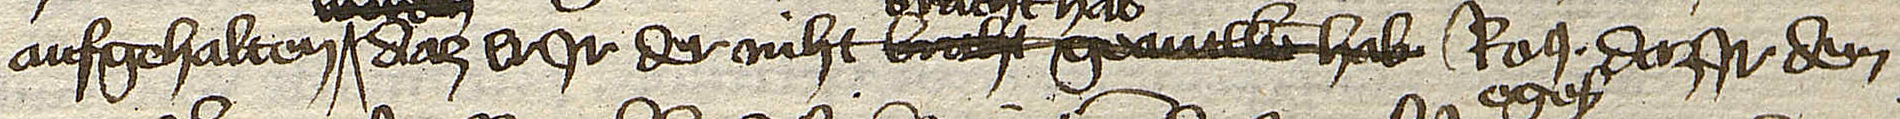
aufgehalten daʒ Er Ir der niht braht geantw*t hab Ro* . daʒ Ir dem
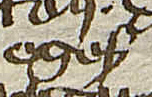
egeſ*
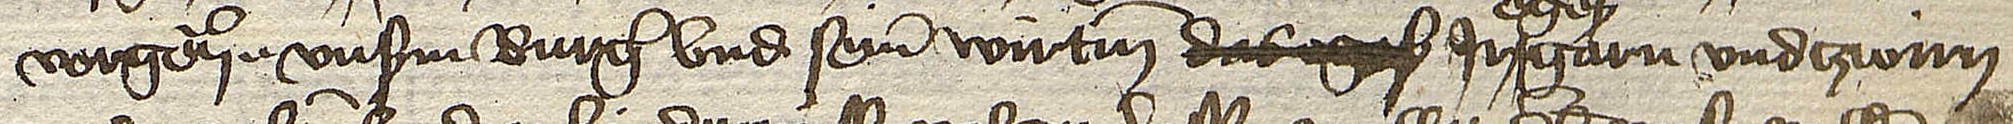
vorgen* ~ vnſ*m Burg* vnd ſein* wirtin* das geſ* Ir garn vnd cʒwirn
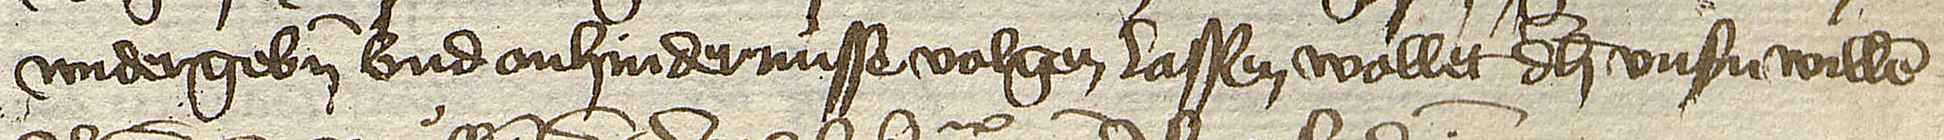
widergebn* vnd onhindernüſſe volgen laſſen wollet d*h vnſ*n wille*
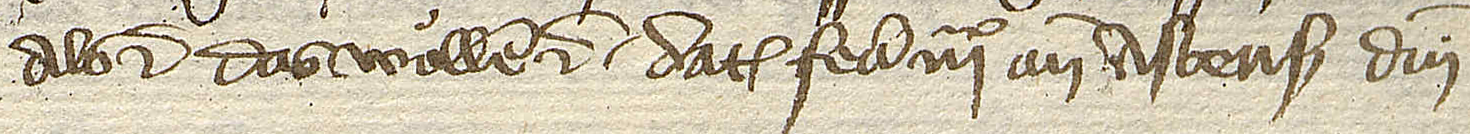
Als ec* das wölle* ec* / dat* fea* iii* Aſcenſ* dni*
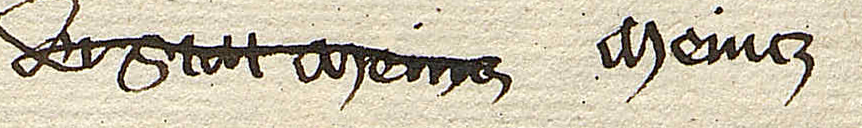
der Stat Meincʒ Meincʒ
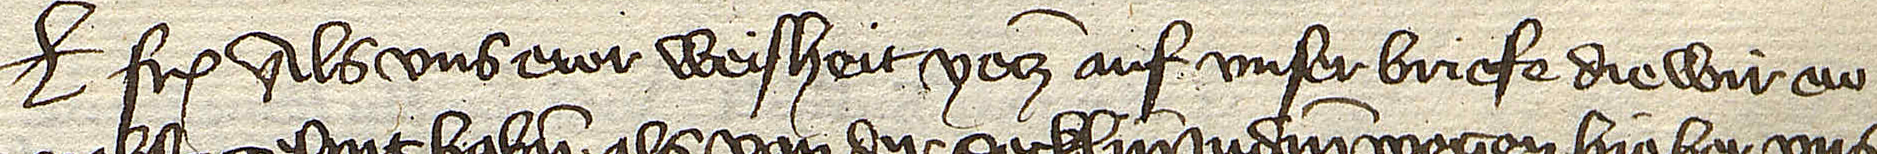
L* fr* Als vns ewr weiſheit yecʒ* auf vnſer briefe die wir ew
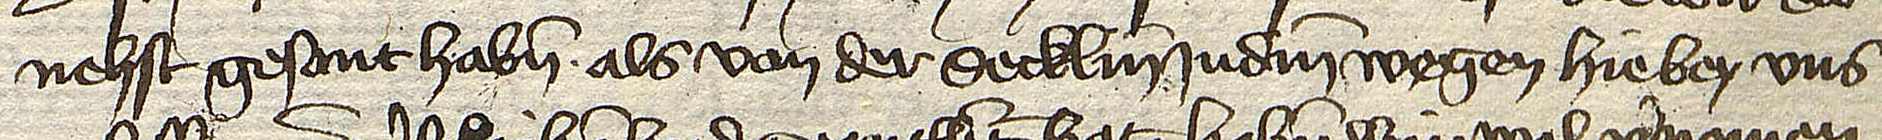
nehſt geſant habn* als von der Secklin* Iudin* wegen hie bey vns
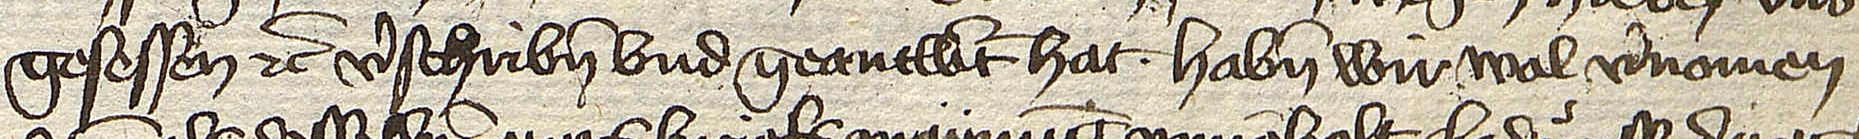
geſeſſen ec* v*ſchribn* vnd geantw*t hat . habn* wir wol v*nomen
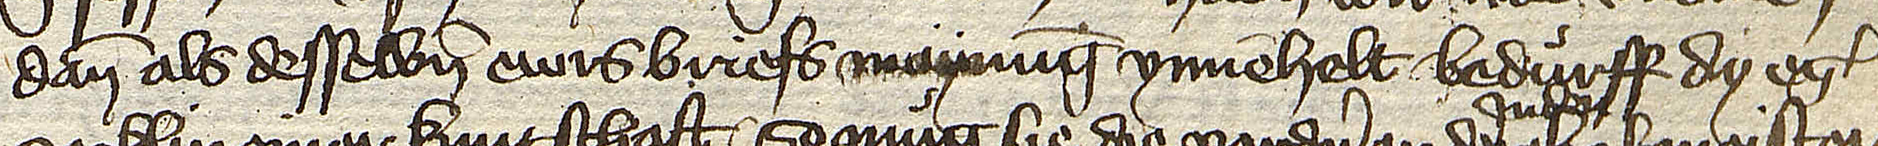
dan* als deſſelbn* ewrs briefs maynug* ynne*helt / bedürff dy eg*
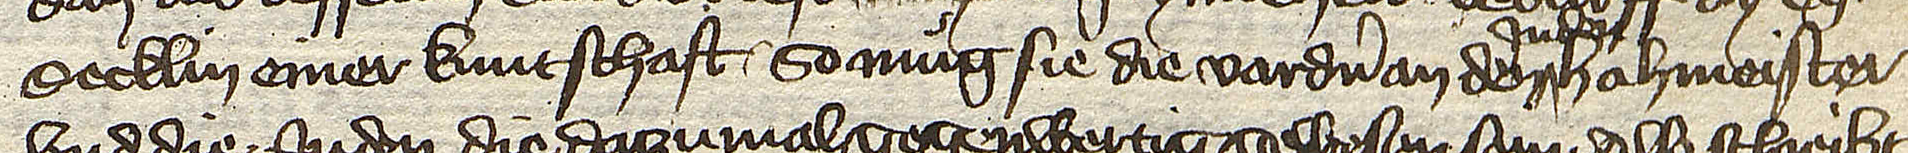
Secklin einer kuntſchaft / So müg ſie die vordn* an den hohmeiſter
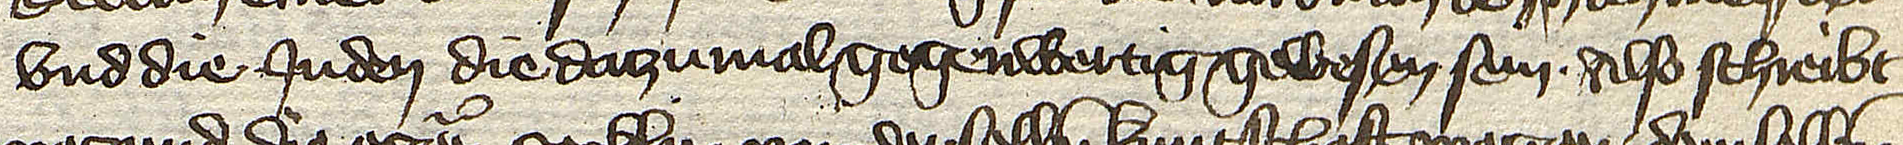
vnd die Iuden die dacʒumal gegenwertig geweſen ſein . Alſo ſchreibt
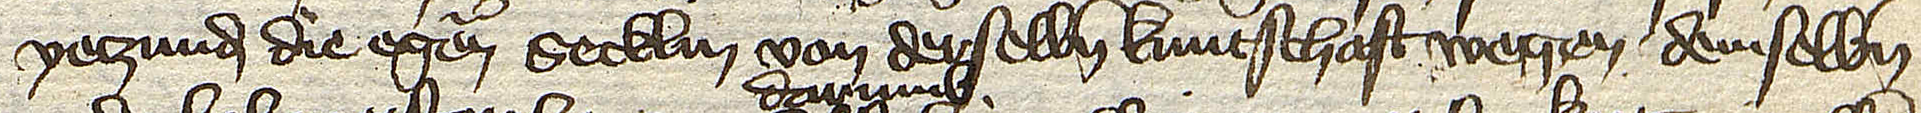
yecʒund* die egen* Secklin von derſelbn* kuntſchaft wegen demſelbn*
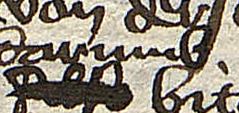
darumb
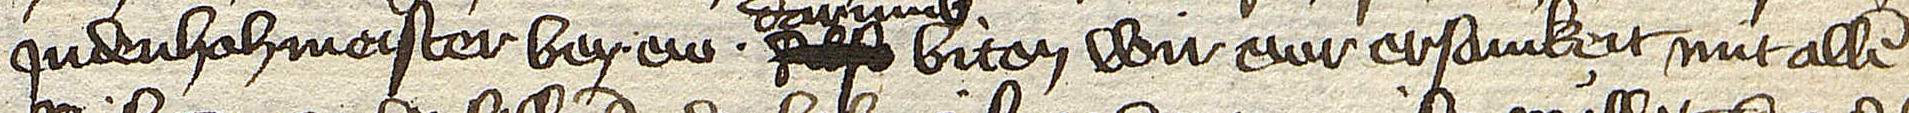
Iudenhohmeiſter bey ew . Alſo biten wir ewr erſamkeit mit alle*
